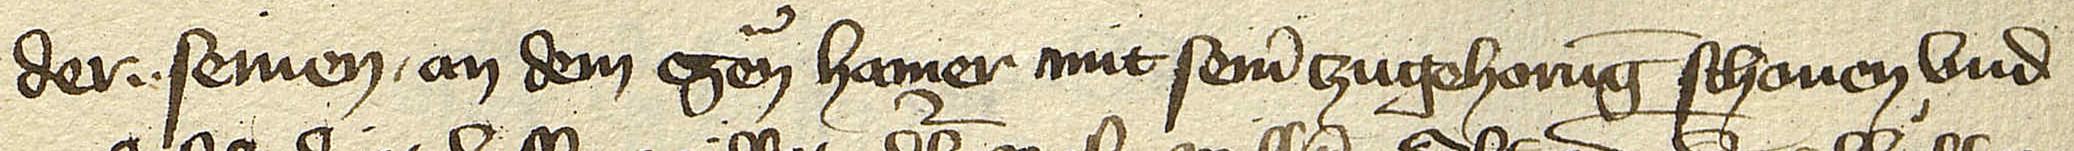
der ~ ſeinen / an dem egen* hamer mit ſein* cʒugehorug* ſchonen vnd
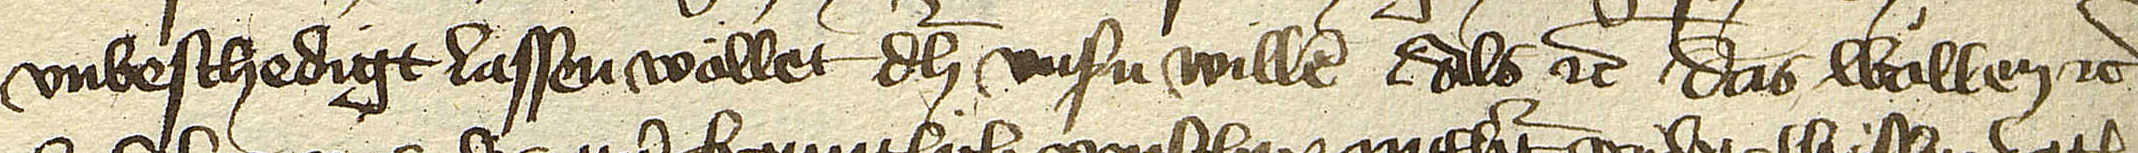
vnbeſchedigt laſſen wöllet dh* vnſ*n wille* / Als ec* / das wöllen ec*
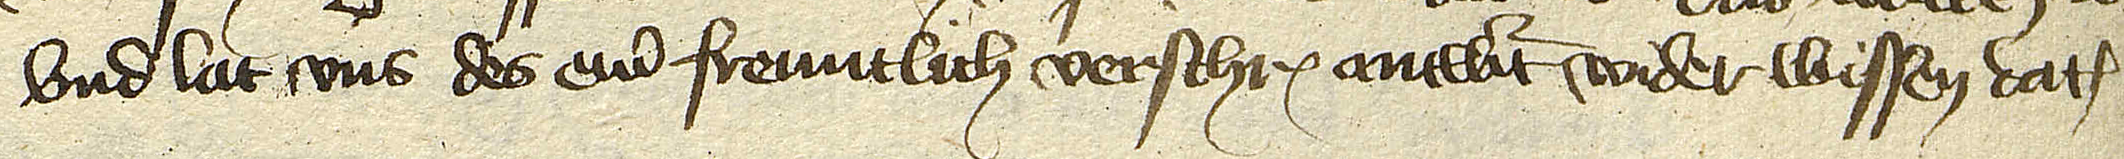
vnd lat vns des ew* freuntlich verſchr* antwt* wider wiſſen dat*
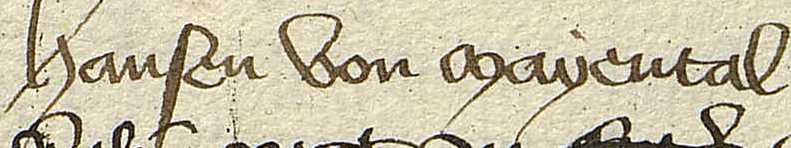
Hanſen von Mayental
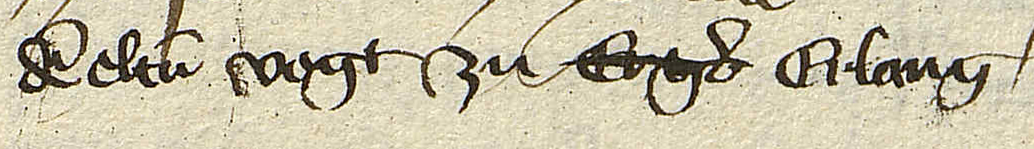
d* eltn* vogt cʒu Ergl Erlang*
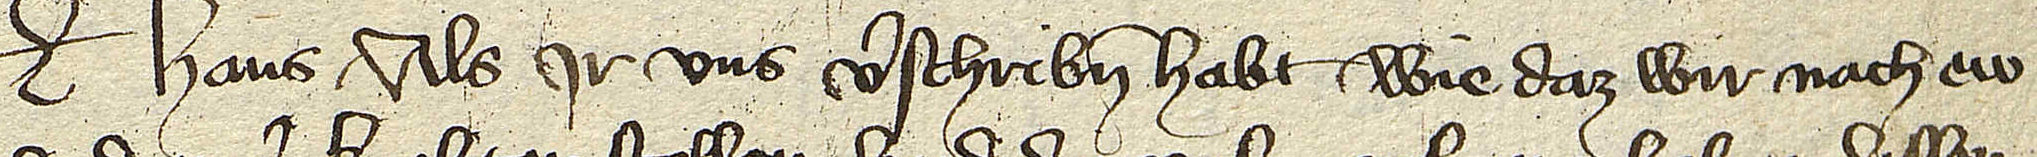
L* Hans / Als Ir vns v*ſchribn* habt / wie daʒ wir nach ew
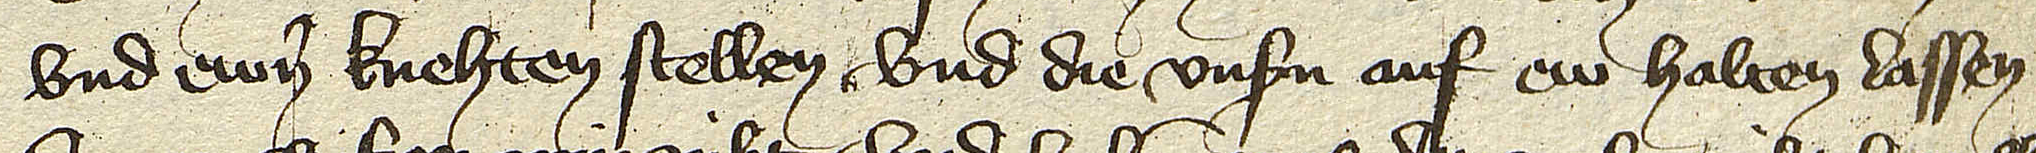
vnd ewn* knehten ſtellen / vnd die vnſ*n auf ew halten laſſen
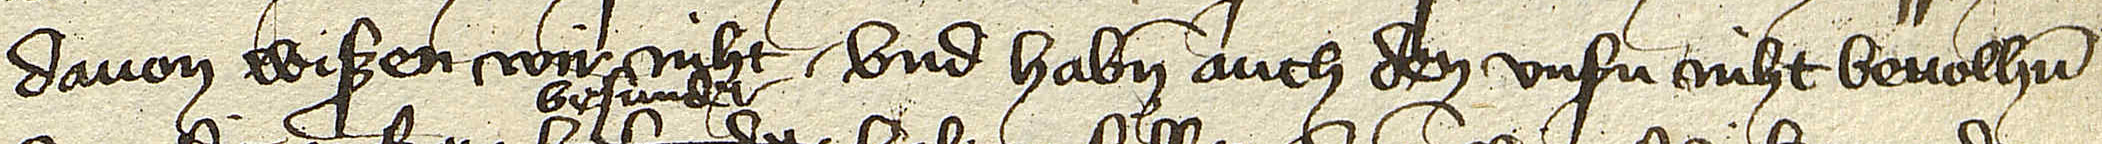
dauon wiſʒen wir niht / vnd habn* auch den vnſ*n niht beuolhn*
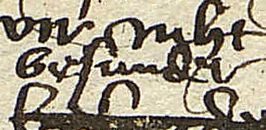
beſunder
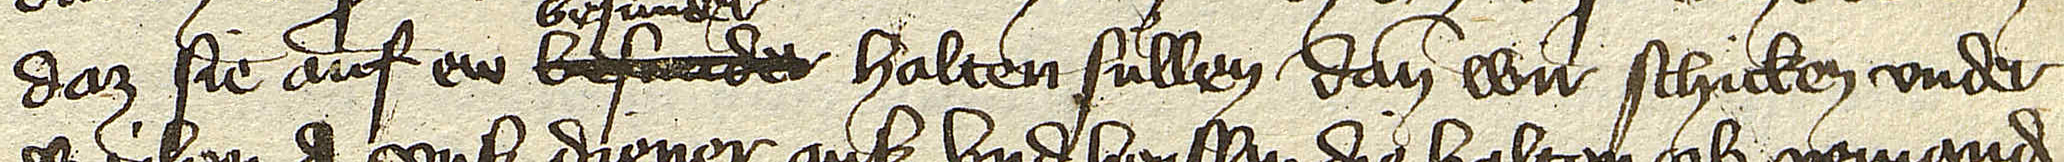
daʒ ſie auf ew beſunder halten ſüllen / dan* wir ſchicken vnder
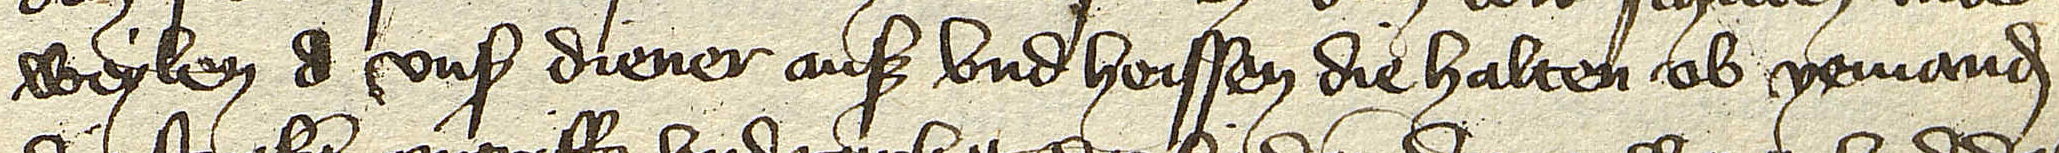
weylen d vnſ* diener auſʒ vnd heiſſen die halten / ob yemand*
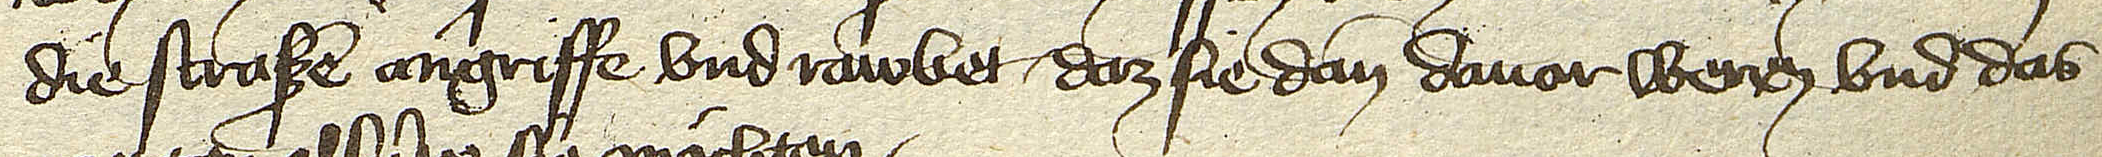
die ſtraſʒe* angriffe vnd rawbet daʒ ſie dauor weren vnd das
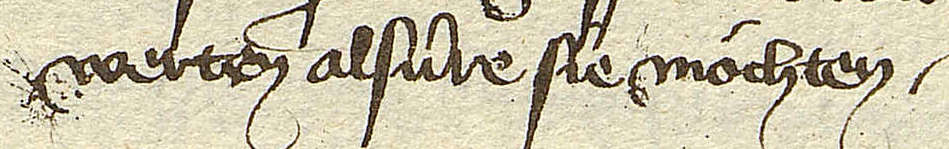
werten alſw*re ſie möchten /
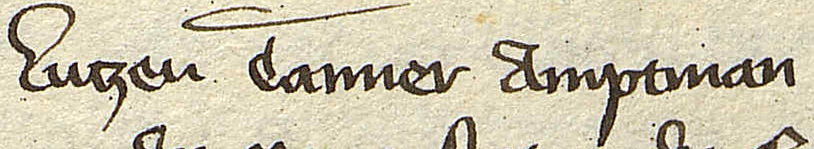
Lucʒen Tanner Amptman
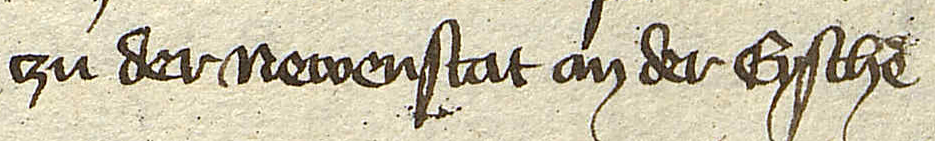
cʒ der Newenſtat an der Eyſche
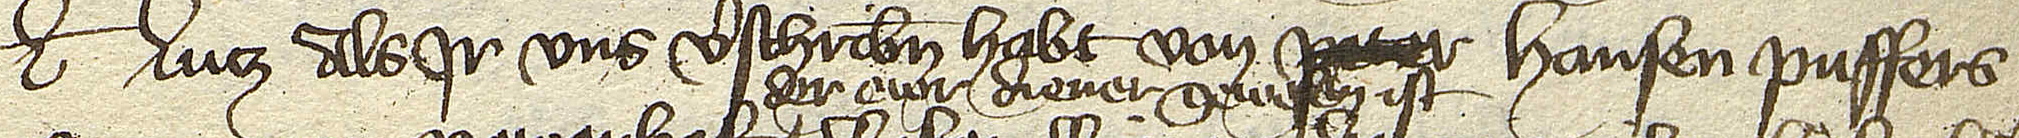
L* Lucʒ Als Ir vns v*ſchribn* habt von peter Hanſen Puffers
